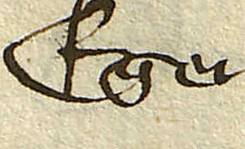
Eger
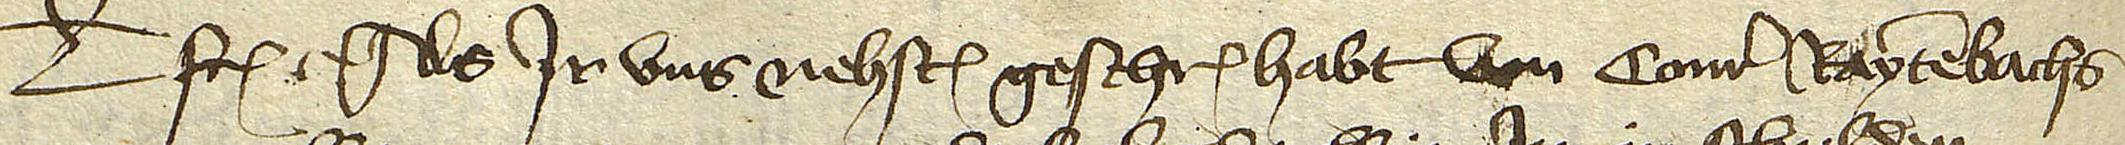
L* fr* / Als Ir vnd nehſt* geſchr* habt von Conr* Rayte*bachs
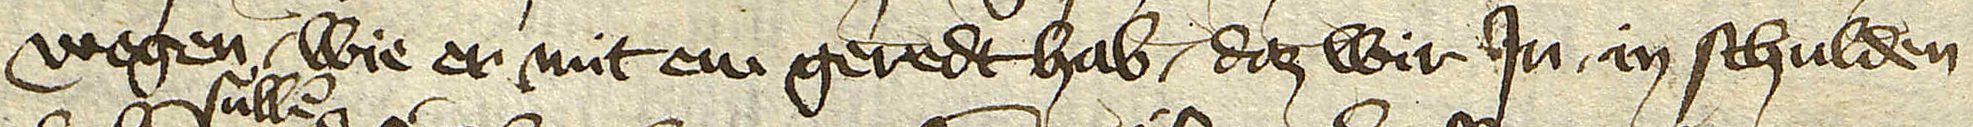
wegen / wie er mit ew geredt hab / daʒ wir In in ſchulden
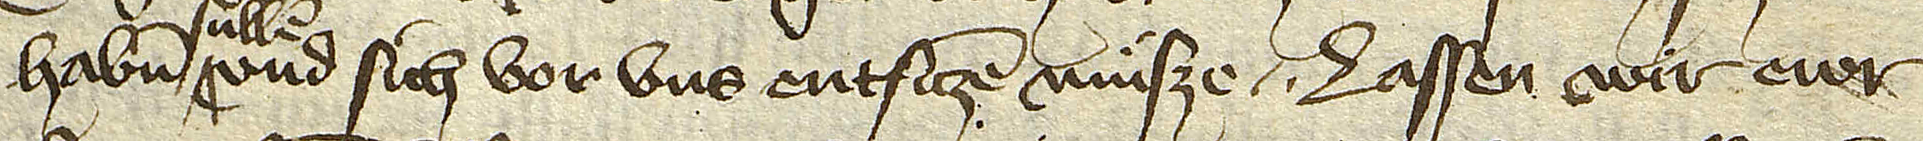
habn* vnd ſich vor vns entſicʒe* müſʒe / . Laſſen wir ewr
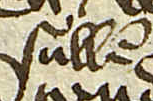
ſülle*
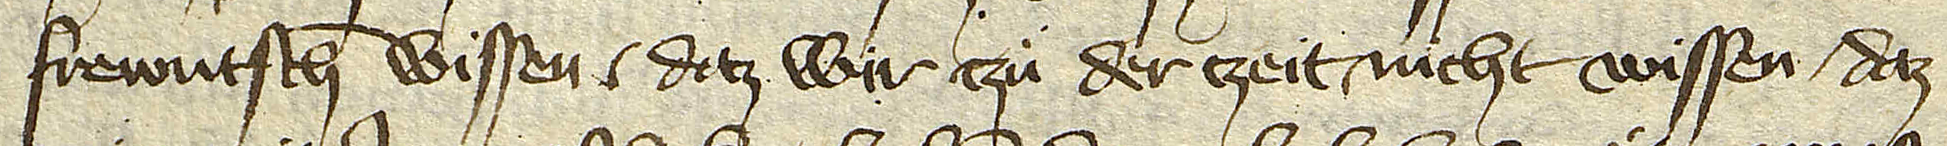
frewntſch* wiſſen / daʒ wir cʒü der cʒeit nicht wiſſen / daʒ
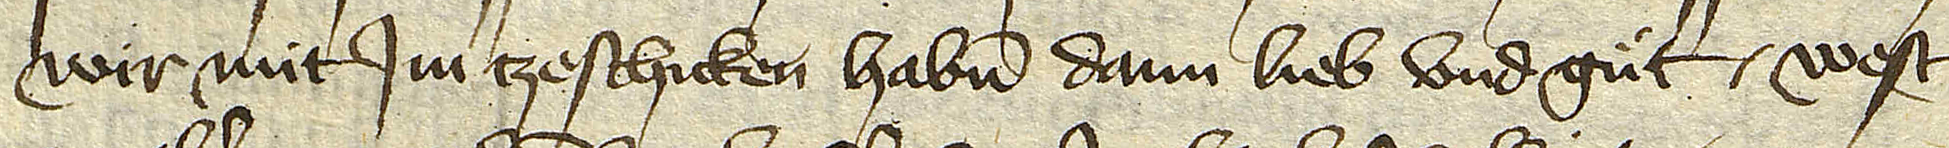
wir mit Im cʒeſchicken habn* dann lieb vnd güt / weſt
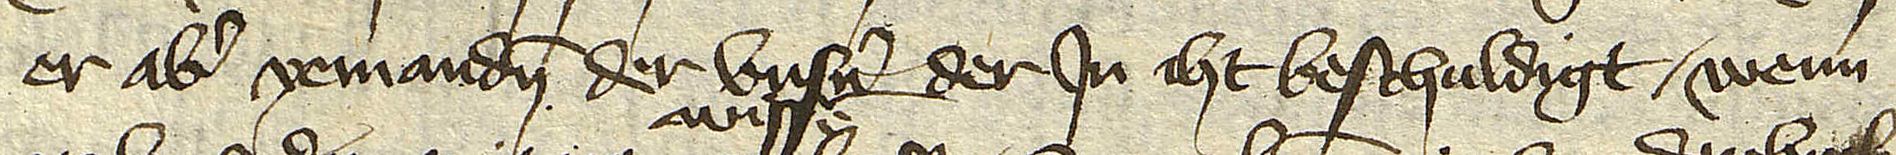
er ab* yemandn* der vnſn* der In iht beſchuldigt / wenn
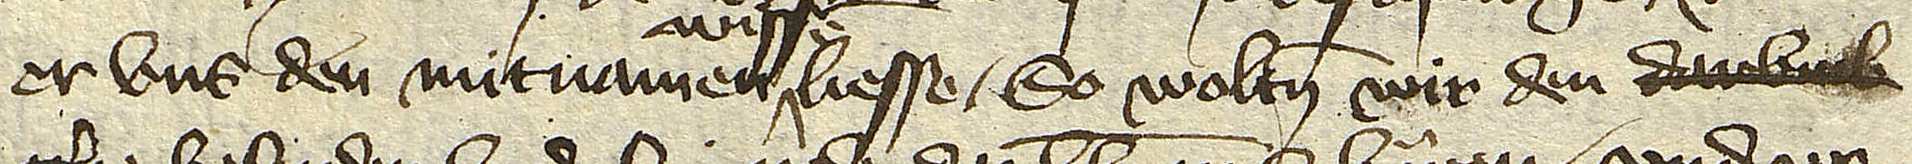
er vns den mitnamen lieſſe / So woltn* wie den darvmb
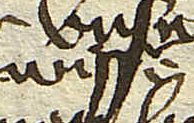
wiſſe*
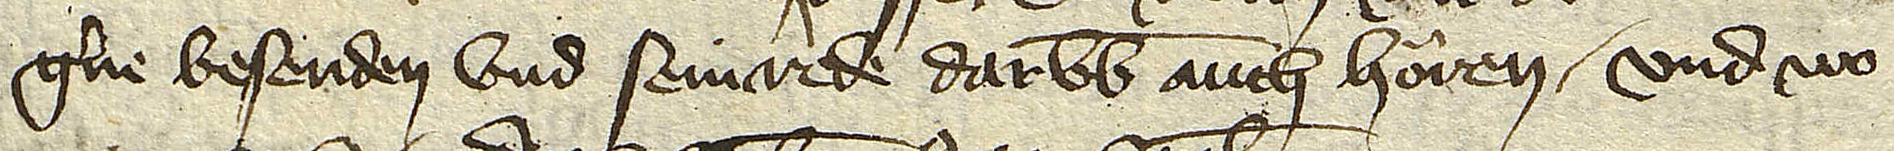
g*ne beſenden vnd ſein rede darv*b auch hören / vnd wo
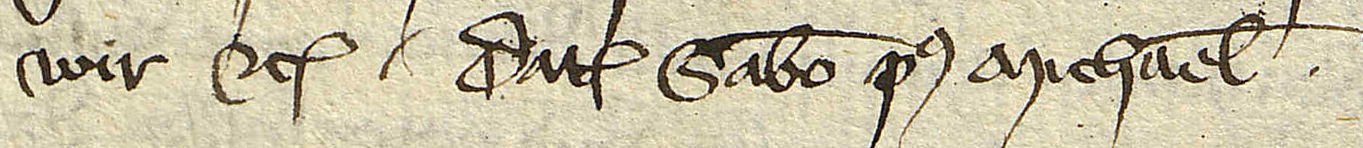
wir ec* / Dat* Sabo* p* Michael* .
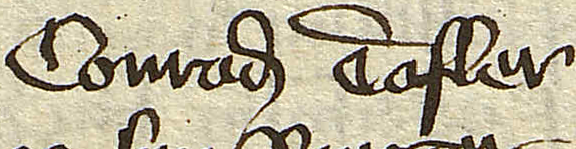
Conrad Tafler
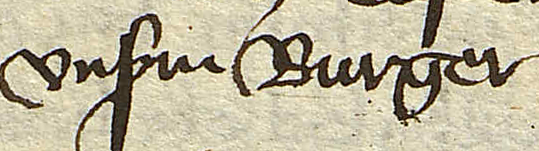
vnſ*m Burger
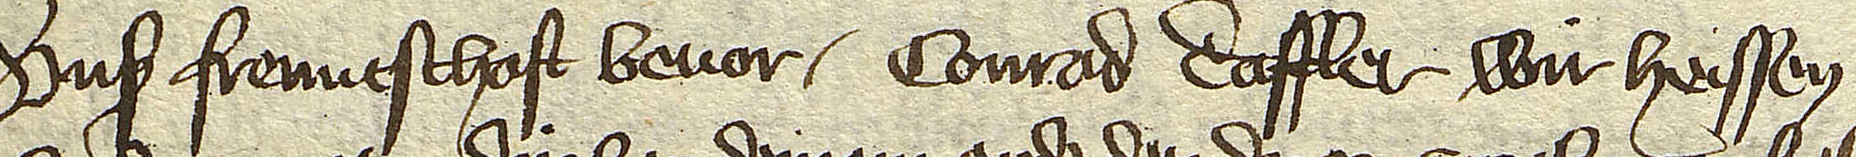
Vnſ* freuntſchaft beuor / Conrad Taffler wir heiſſen
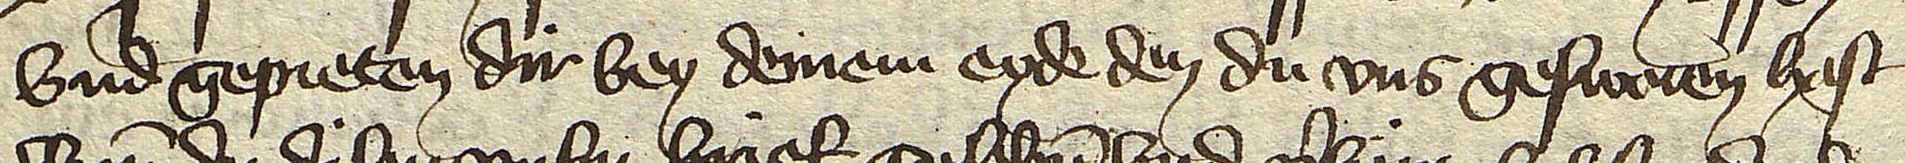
vnd gepieten dir bey deinem eyde den du vns geſworen haſt
